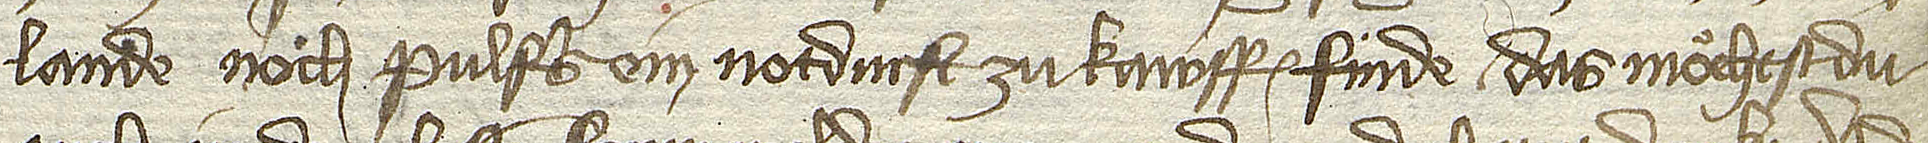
lande noch Pulf*s ein notdurft ʒu kawff* finde / das möchtſt du
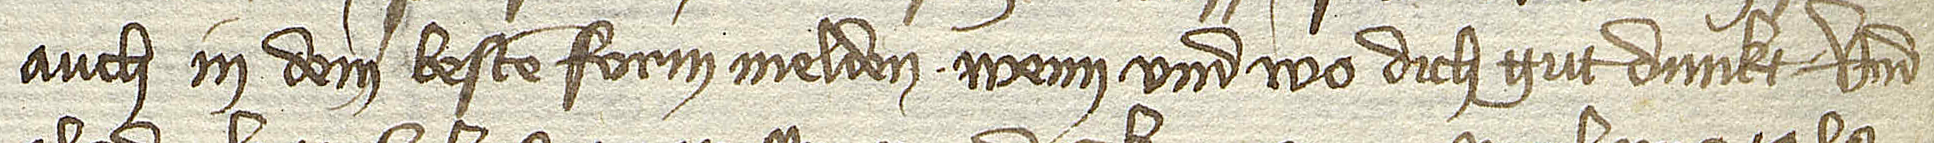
auch in dem beſte* form melden . wenn vnd wo dich gut dunkt / Vnd
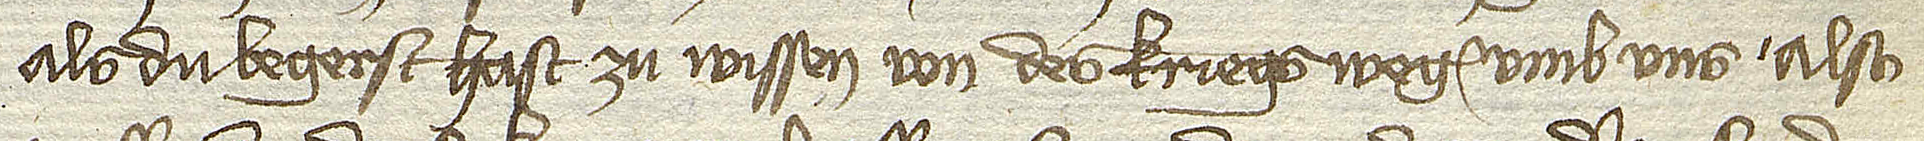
als du begerſt haſt ʒu wiſſen von des kriegs weg* vmb vns / alſo
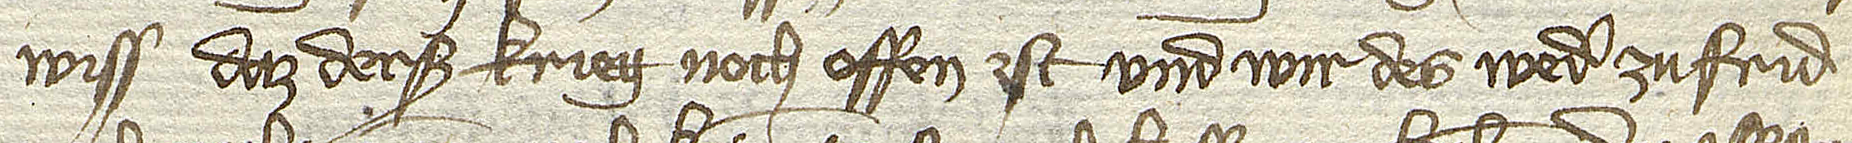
wiſſ daʒ derſ* krieg noch offen iſt vnd wir des wed* ʒu frid
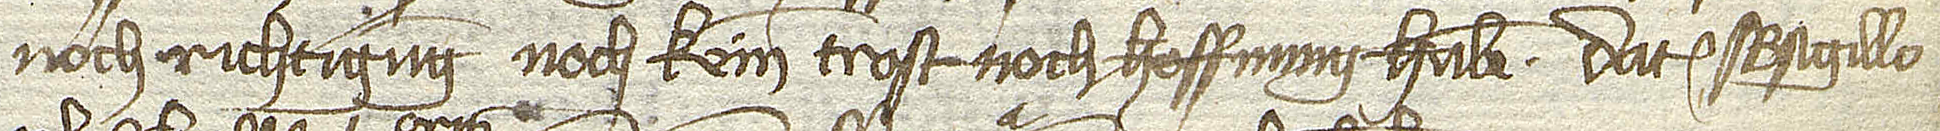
noch richtigu*g noch kein* troſt noch hoffnung habe* . dat* ſ*B ſigillo
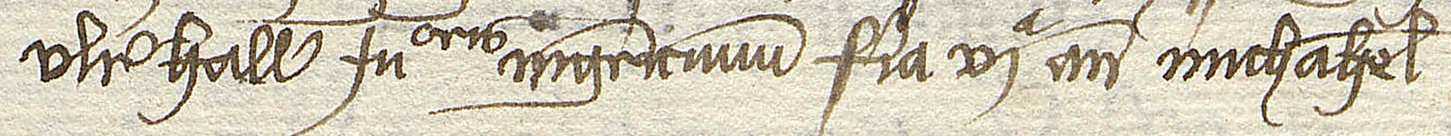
vlr* hall* Iu* m*g*riciuiu* fia* vi* an* michahel*
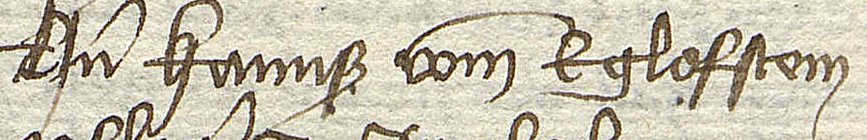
H*n hannſ* vom* Eglofſtein
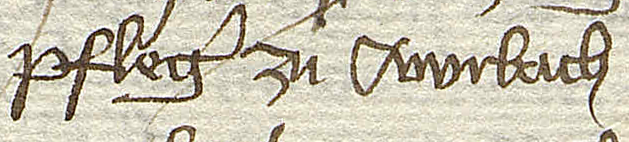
pfleg* ʒu Awrbach
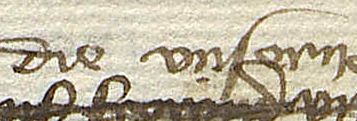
die vnſern
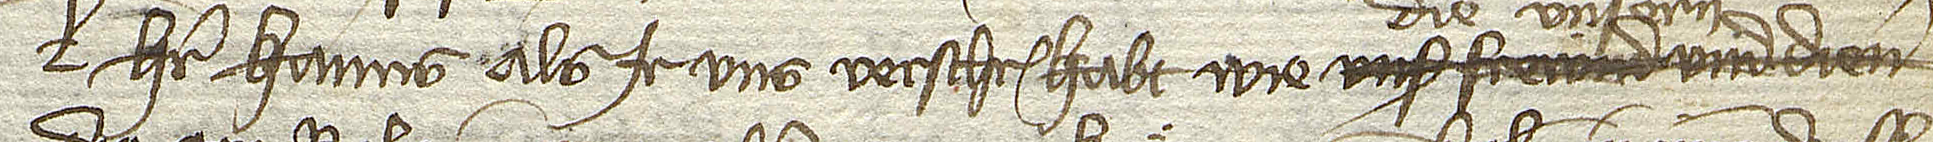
L* h*r hanns als Ir vns verſchr* habt wie vnſ* frewnd vnd dien*
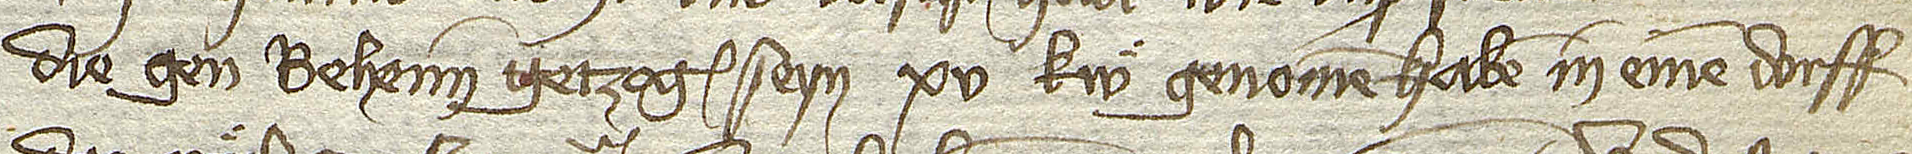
die gen Beheim gecʒog* ſeyn xv kw genome* habe* in eine* dorff
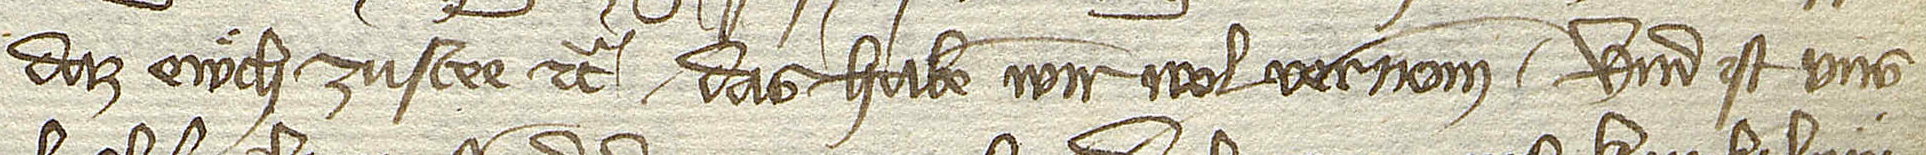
daʒ ewch ʒuſtee ec* / das habe* wir wol vernom* / Vnd iſt vns
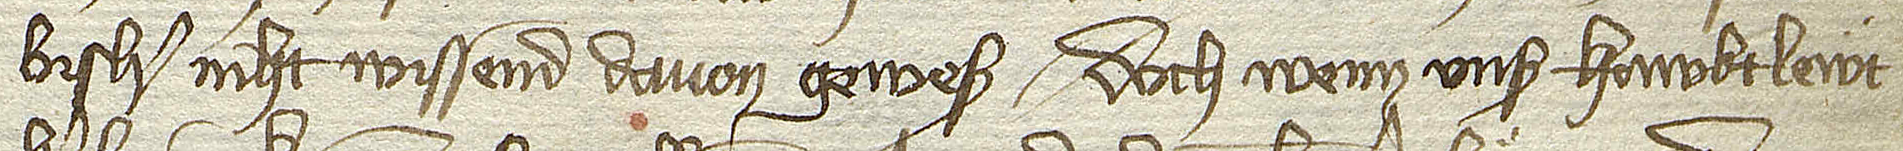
biſh* niht wiſſend dauon geweſ* / Doch wenn vnſ* hawbtlewt
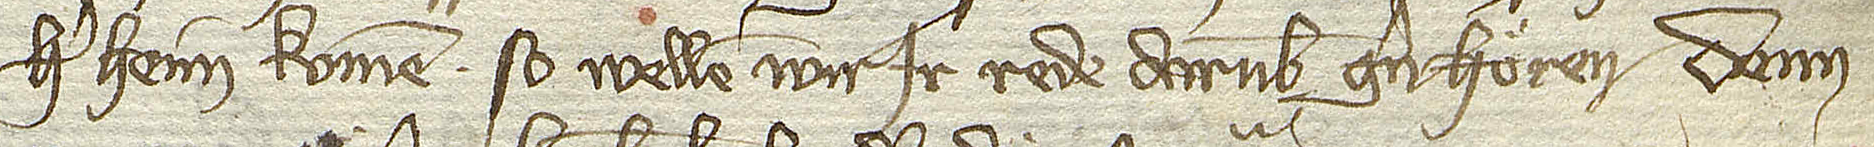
h* heim kome* . ſo welle* wir Ir rede darub* g*n hören / Denn
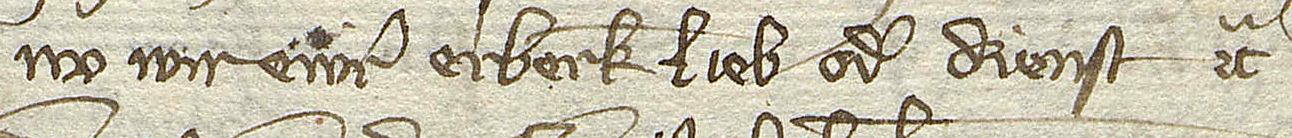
wo wir ew*r erberk* lieb od* dienſt ec*
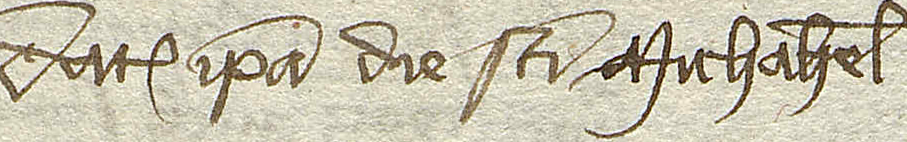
Dat* ipa* die ſti* Michahel*
